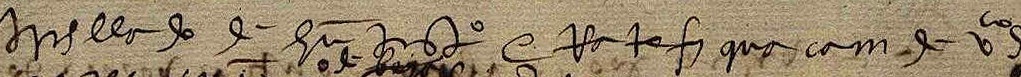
tresllado de hū testo e Ratefjquaçam de vco de
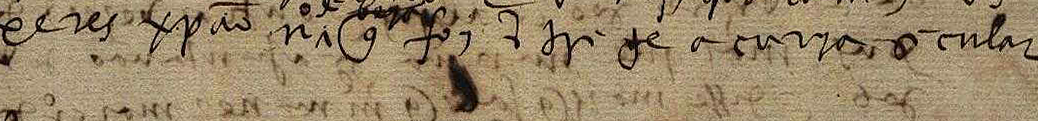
xeres xpão no de beja q̄ foy ētrege a curya secular
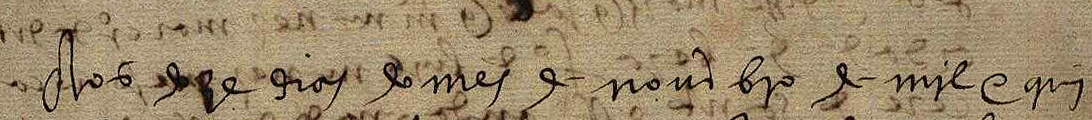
Aos doze dias do mes de nouēbro de mil e quy
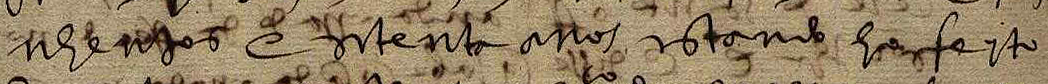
nhentos e setenta anos estando ho feyto
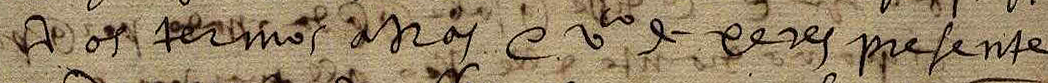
ē os termos atras e vco de xeres presente
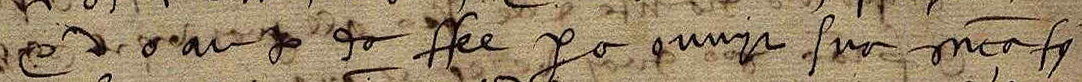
e ē o auto da ffee ꝑa ouuyr sua snç̄a fy
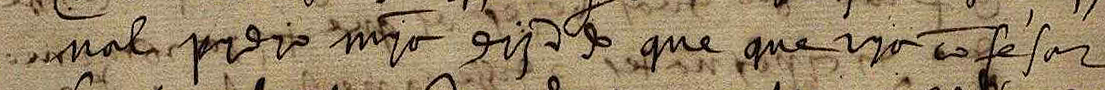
nal pydyo mȳa dizēdo que querya c̄ofesar
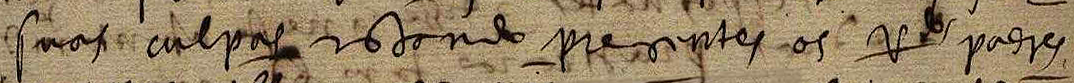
suas culpas estando presentes os Rdos padres
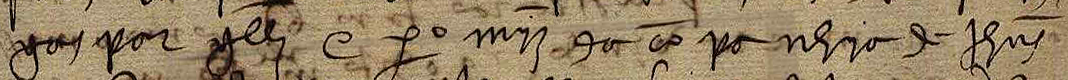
gaspar gl̄lz e ꝑo mȳz da cōpanhia de Jhūs
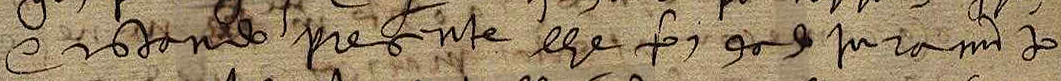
e estando presente lhe foy dado Juramēto
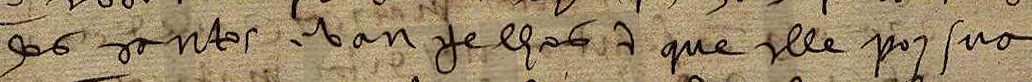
dos santos evangelhos ē que elle poz sua
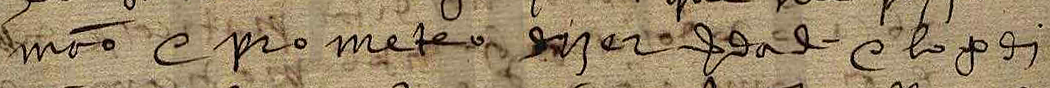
mão e prometeo dyzer ꝟdade e logo dy
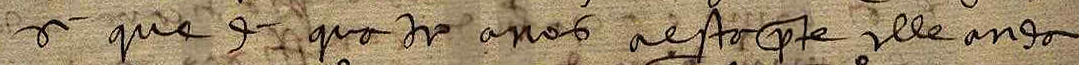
se que de quatro anos a esta p̄te elle anda
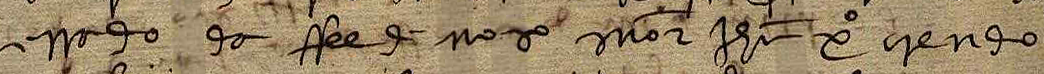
errado da ffee de noso snōr Jhū xo crendo
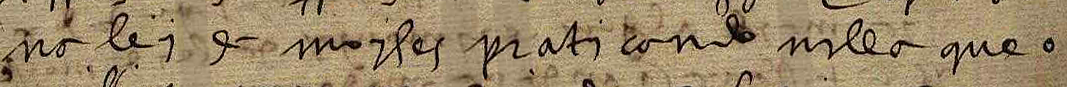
na ley de moyses pratycando nella que o
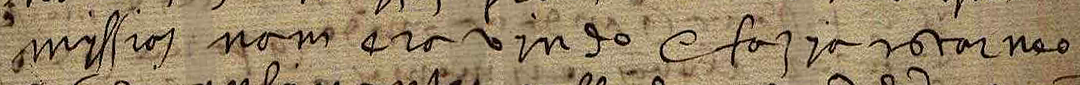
myssias nam era vyndo e fazya escarneo
